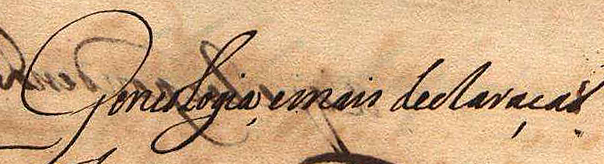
Geneologia, e mais declaraçaõ
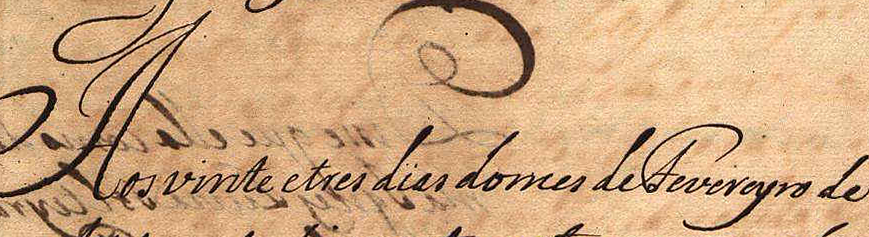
Aos vinte e tres dias do mes de Fevereyro de
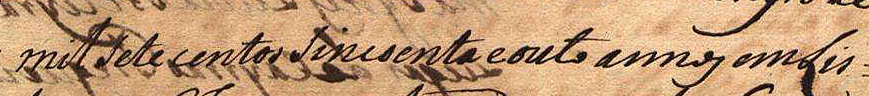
mil setecentos sincoenta e outo annos em Lis
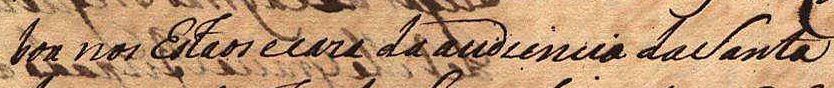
boa nos Estaos e caza da audiencia da Santa
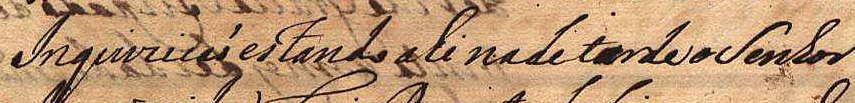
Inquiziçaõ estando ahi na de tarde o Senhor
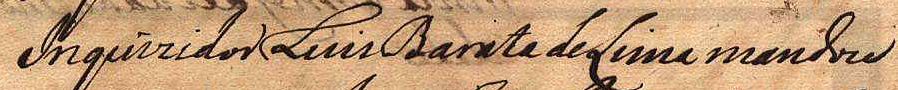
Inquizidor Luiz Barata de Lima mandou
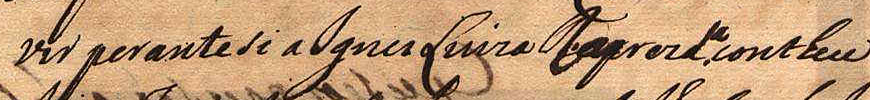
vir perante si a Ignes Luiza Raprezd.a contheu
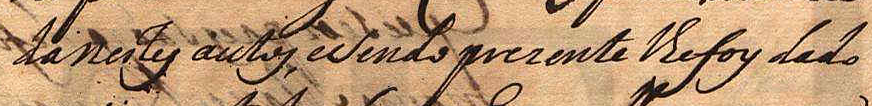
da nestes autos, e sendo prezente lhe foy dado
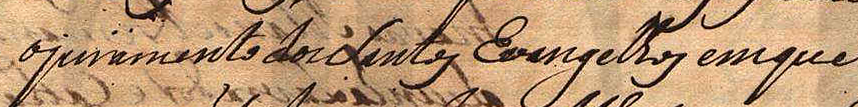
o juramento dos Santos Evangelhos em que
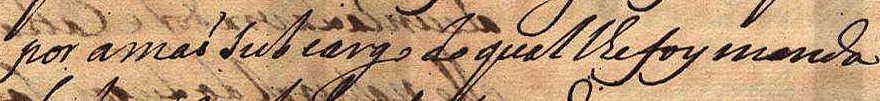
por a maõ sub cargo do qual lhe foy manda
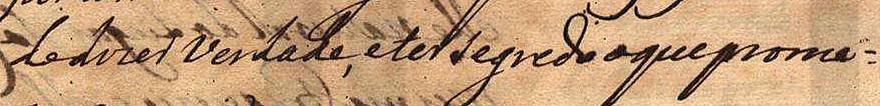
do dizer verdade, e ter segredo o que prome
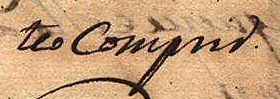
teo comprir.
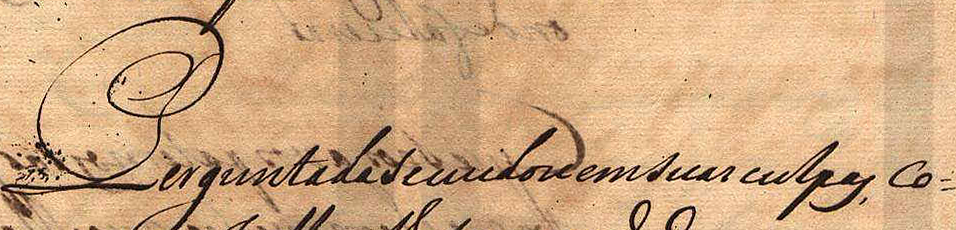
Perguntada se cuidou em suas culpas, co
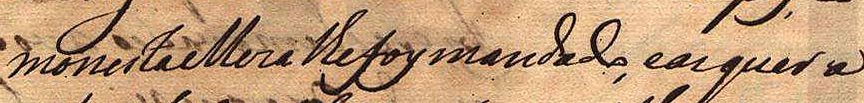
mo nesta Meza lhe foy mandado, e as quer a
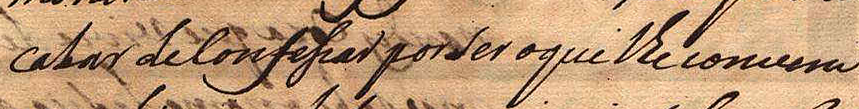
cabar de Confessar por ser o que lhe conuem
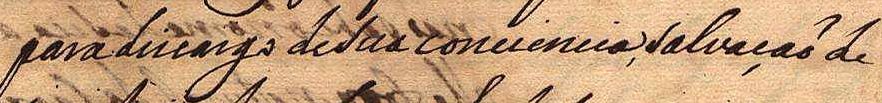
para descargo de sua conciencia, salvaçaõ de
